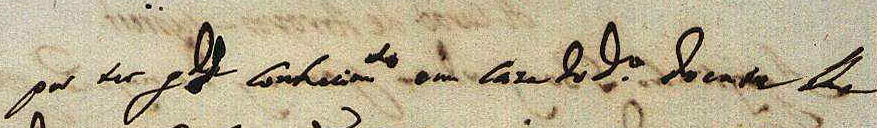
por ter gde Conhecim.to em caza do d.o doente lhe
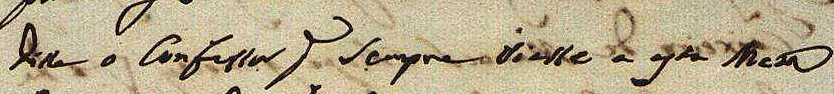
disse o Confessor q̄ sempre viesse a esta Meza
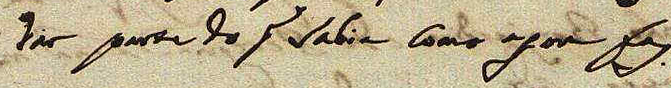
dar parte do q̄ sabia como agora fas.
